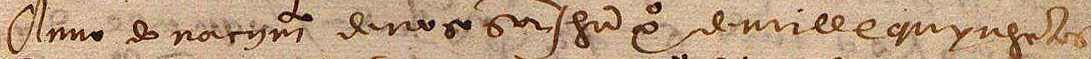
Anno do nacymto de noso s̄or Jhū xo de mill e quynhētos
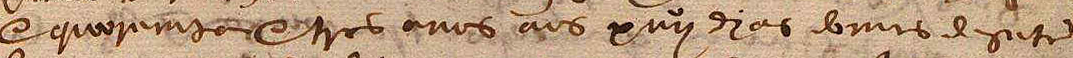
e quoremta e tres anos aos xiiijo djas do mes de setē
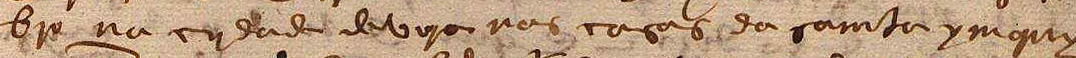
bro na cydade devora nas casas da samta ymquy
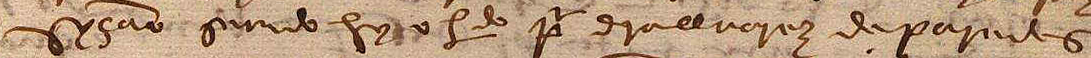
syção semdo hy o Ldo pedralluarez de paredes
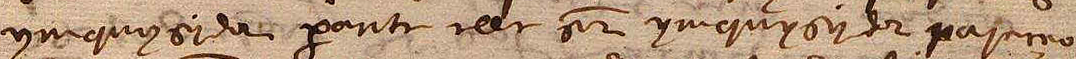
ymquysydor ꝑante elle s̄or ymquysydor pareçeo
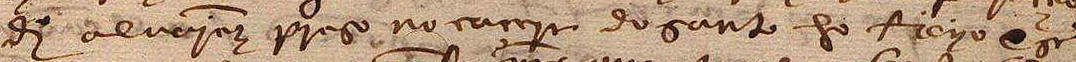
djo aluarez preso no caçere do santo hoficyo e sē
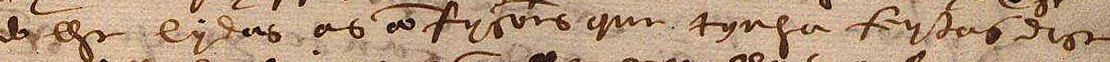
do lhe lydas as c̄ofysões que tynha feytas dise
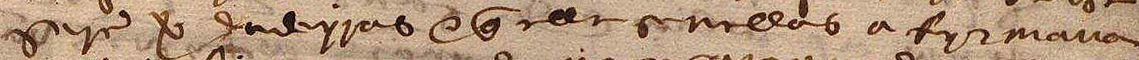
serē ꝟdadeyras e q̄ elle se nellas afyrmaua
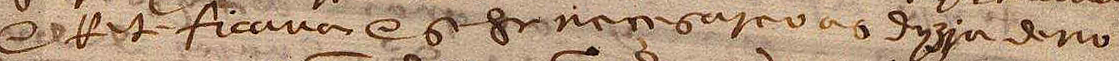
e Reteficaua e se he neçesareo as dyzja de no
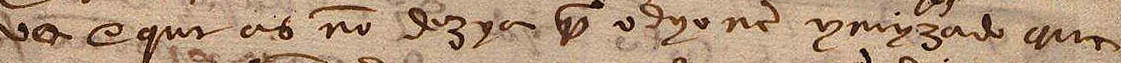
vo e que as n̄o dezya p̄o odyo nē ymyzado que
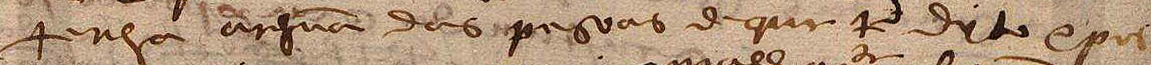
tenha a nhūa das pesoas de que tē dyto e pos
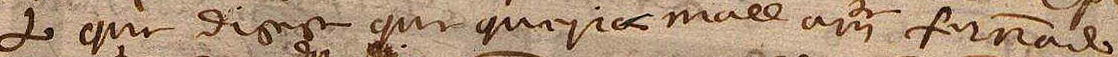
to que disese que queria mall a mte fern̄ado
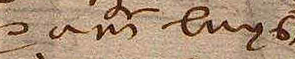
e a mte luys
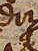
diz
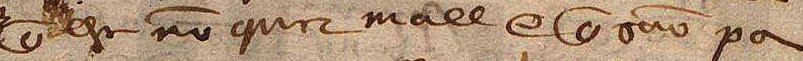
q̄ lhe nō quer mall e q̄ são pa
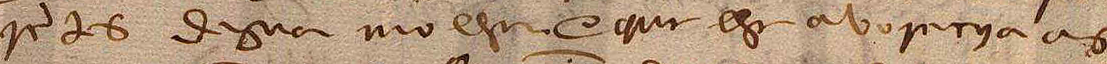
rētes de sua molher e que lhe avorecya as
